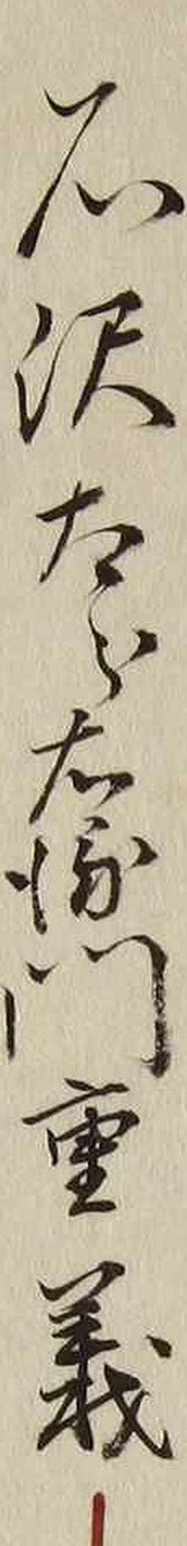石沢太郎右衛門重義
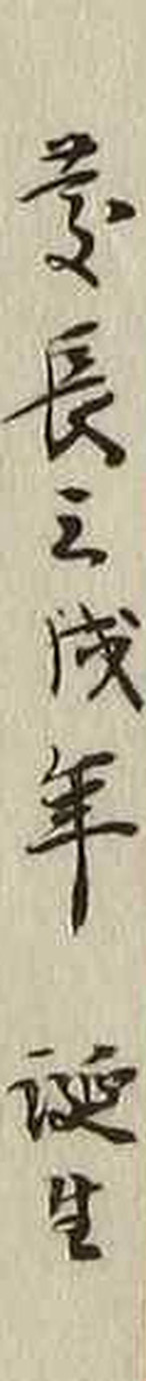慶長三戌年誕生
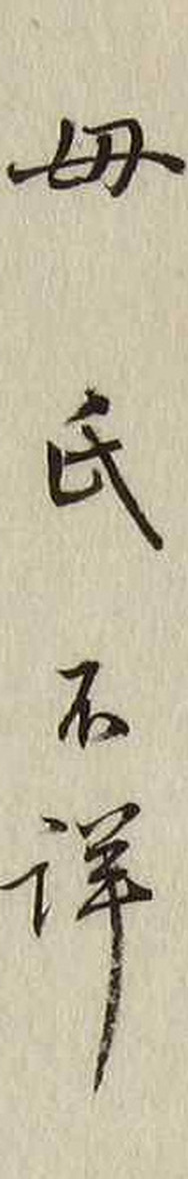母氏不詳
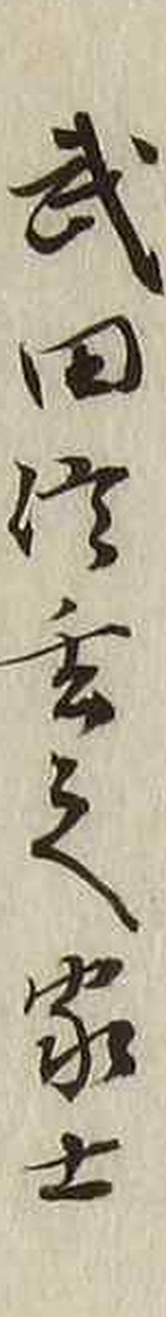武田信玄之家士
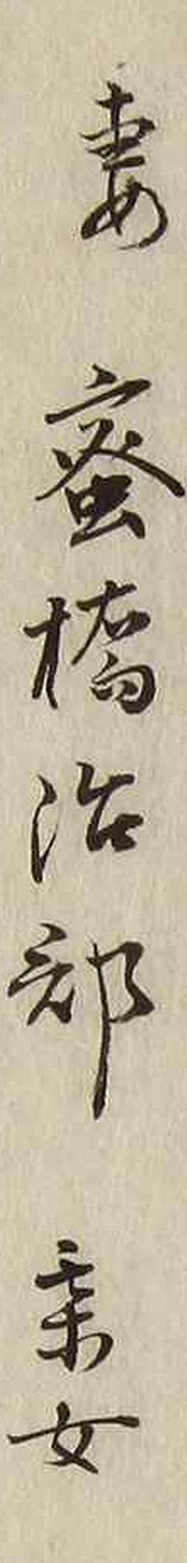妻密橋治部某女
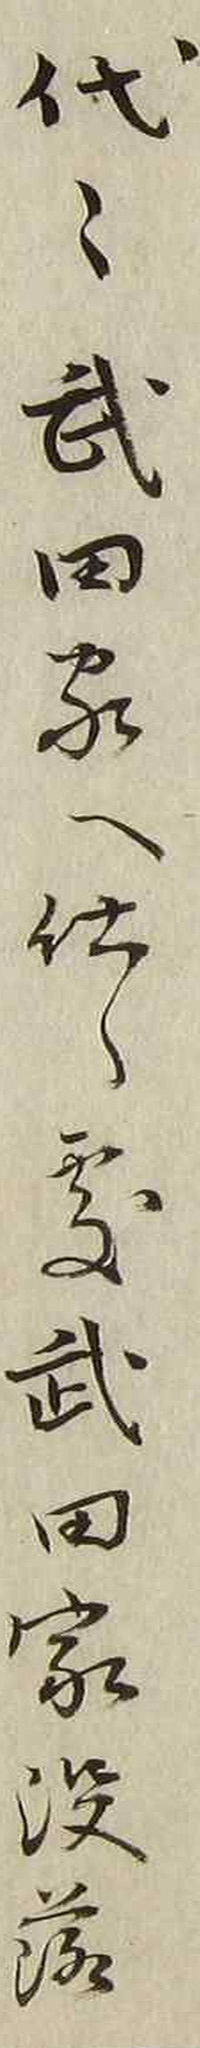代々武田家へ仕候処武田家没落
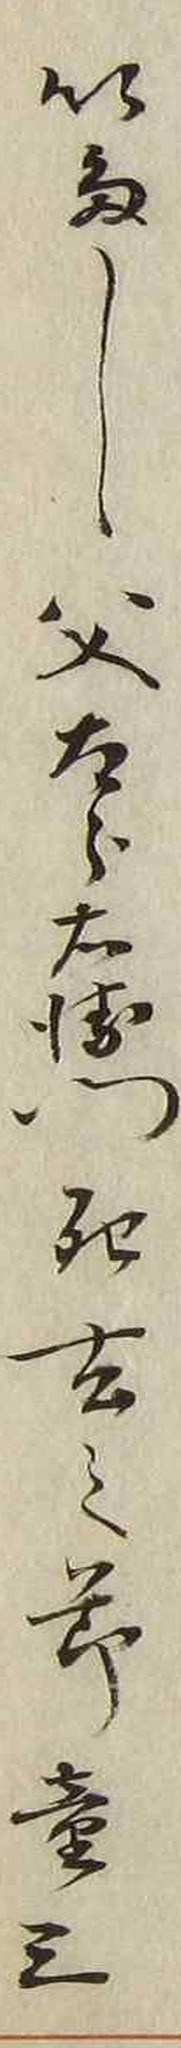いたし父太郎右衛門死去之節童三

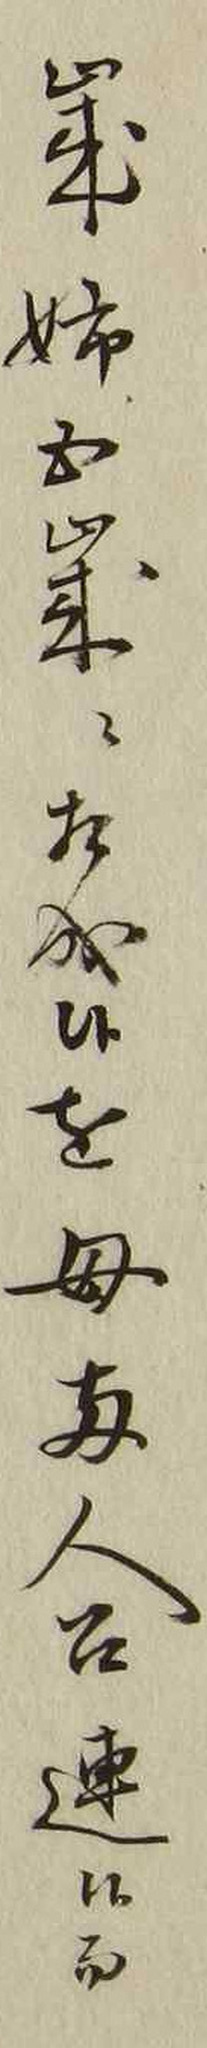歳姉五歳ニ相成り候を母両人召連れ候て
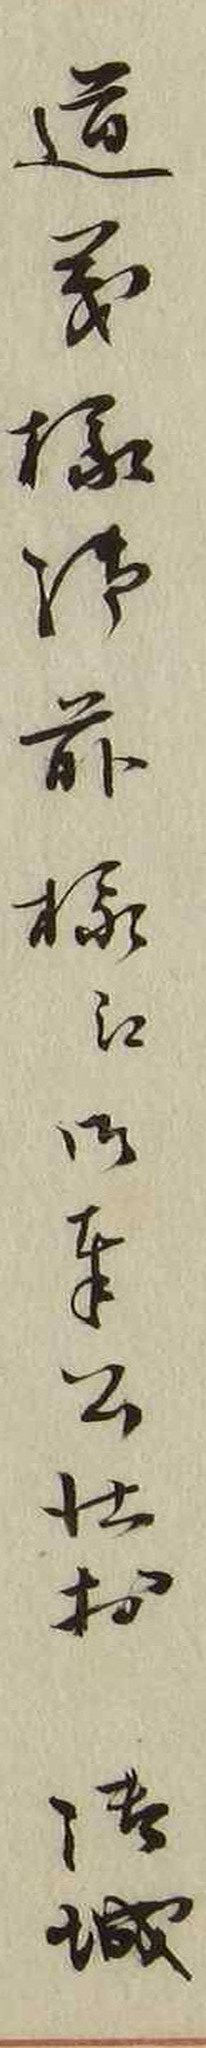道義様御前様へ御奉公仕り御城
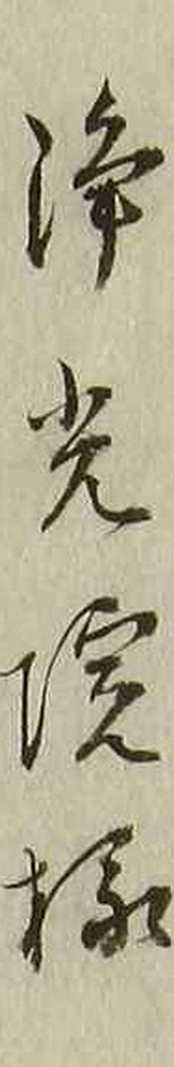浄光院様
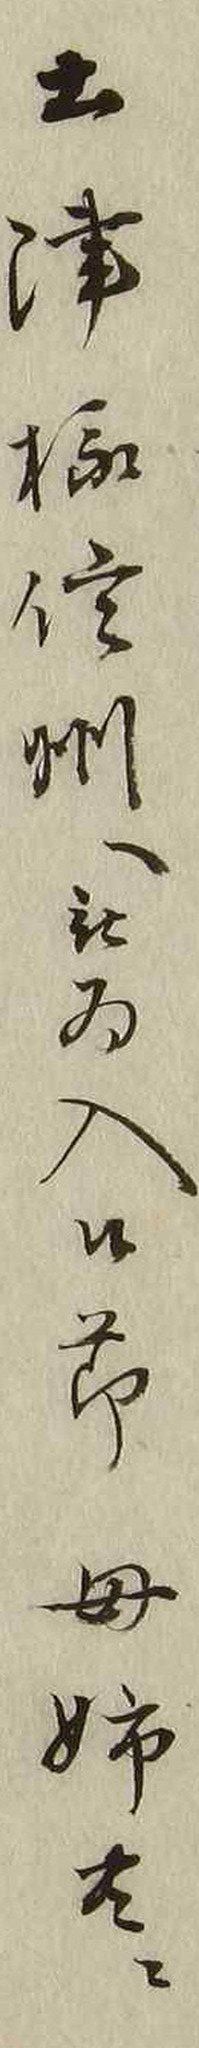土津様信州へ入らせられ候節母姉共ニ
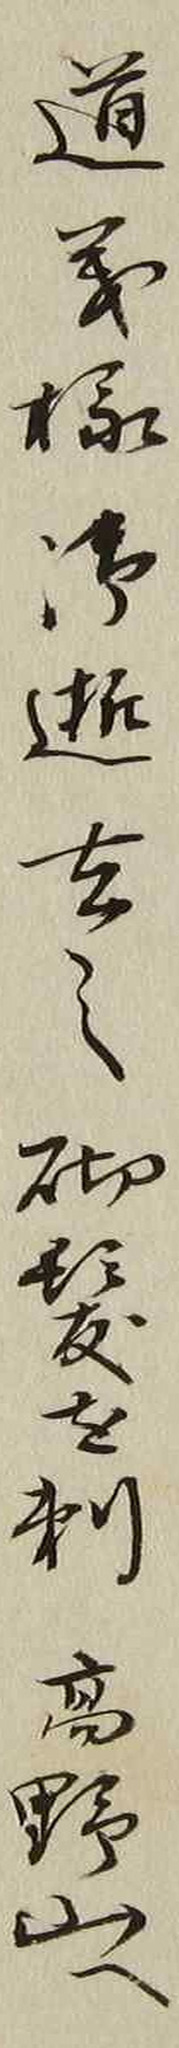道義様御逝去之砌髪を剃り高野山へ
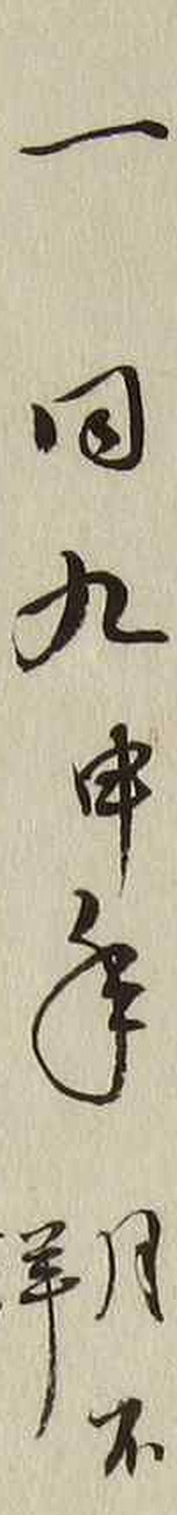一同九申年月不詳
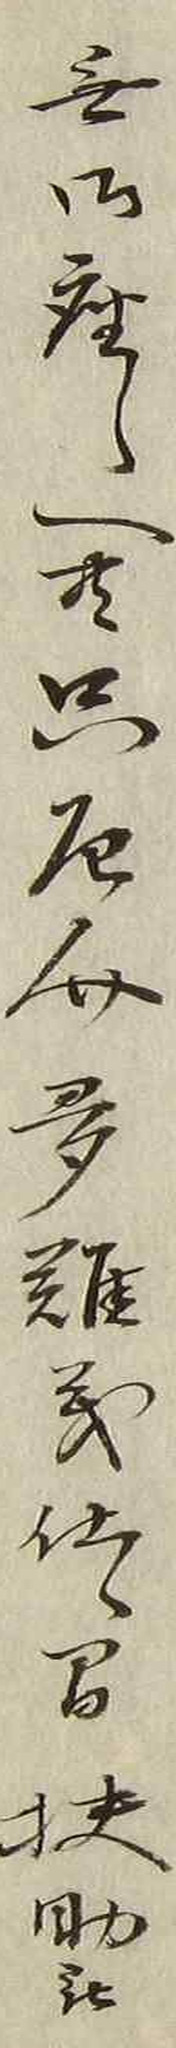御在無く候へ共只厄介多難義仕り候間扶助

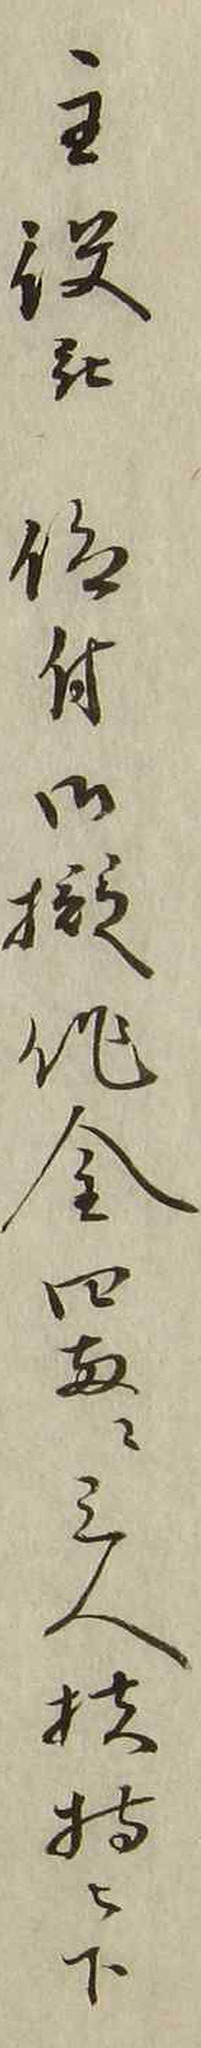主役仰せ付けられ御擬作金四両ニ三人扶持下し
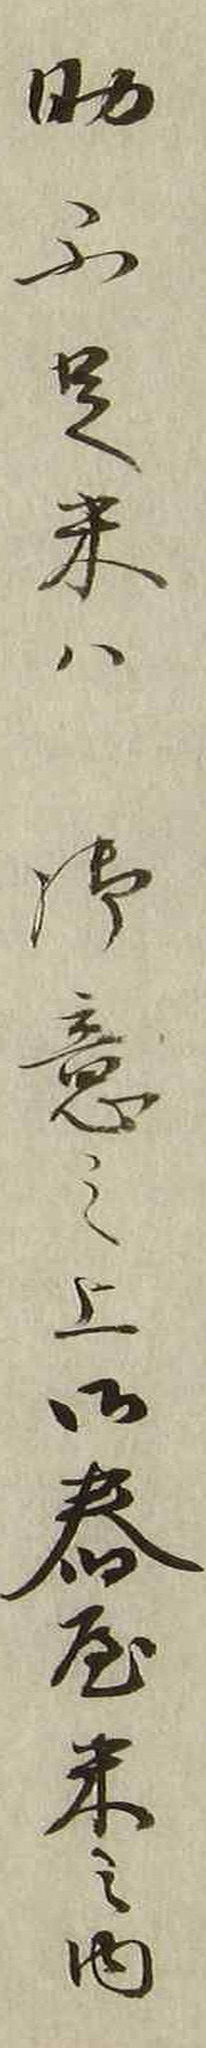助不足米ハ御意之上御春屋米之内
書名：諸士系譜　巻之16　い之部16
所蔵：会津若松市立会津図書館
